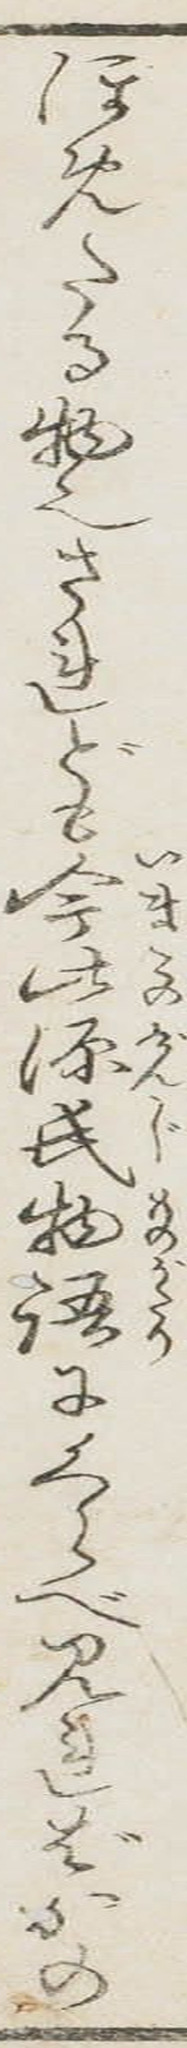ほめたる物也されども今此源氏物語にくらべ見ればかの
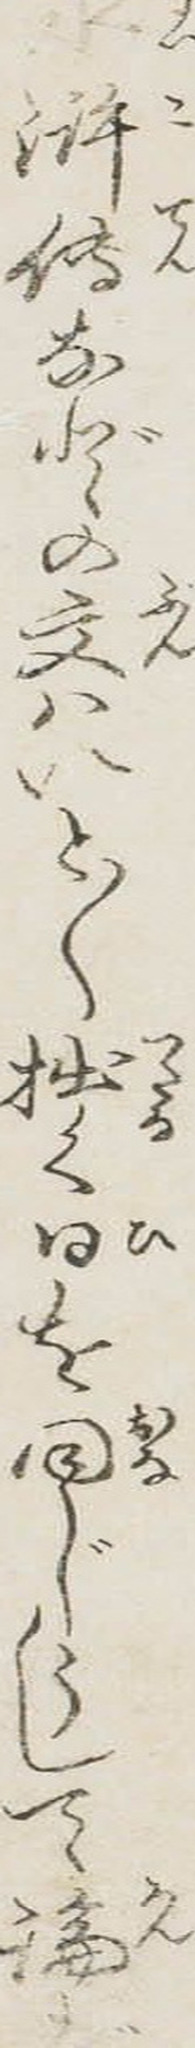水滸伝などの文はいと〳〵拙く日を同じうして論ずべき
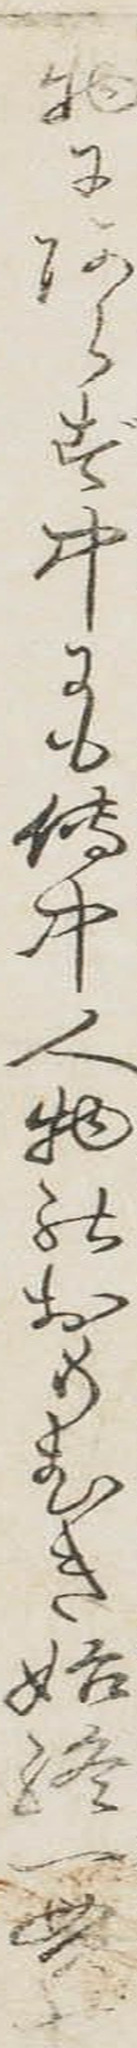物にあらず中にも伝中人物のおもむき始終一貫せざ
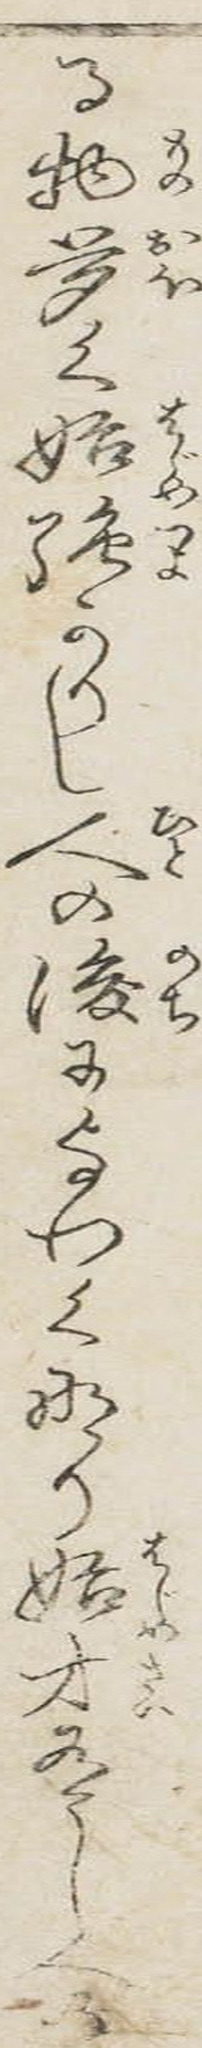る物多く始強かりし人の後によわくなり始才有し人の
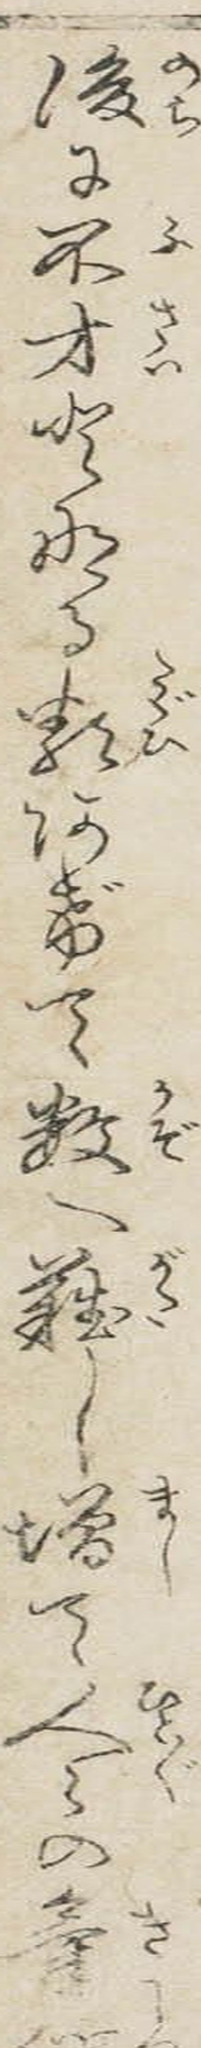後に不才となる類あげて数へ難し増て人々の気質の

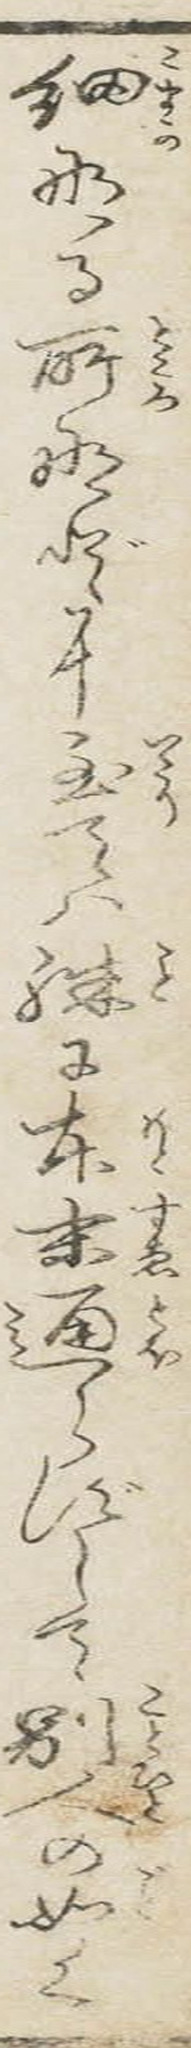細なる所などに至ては殊に本末通らずして別人の如く
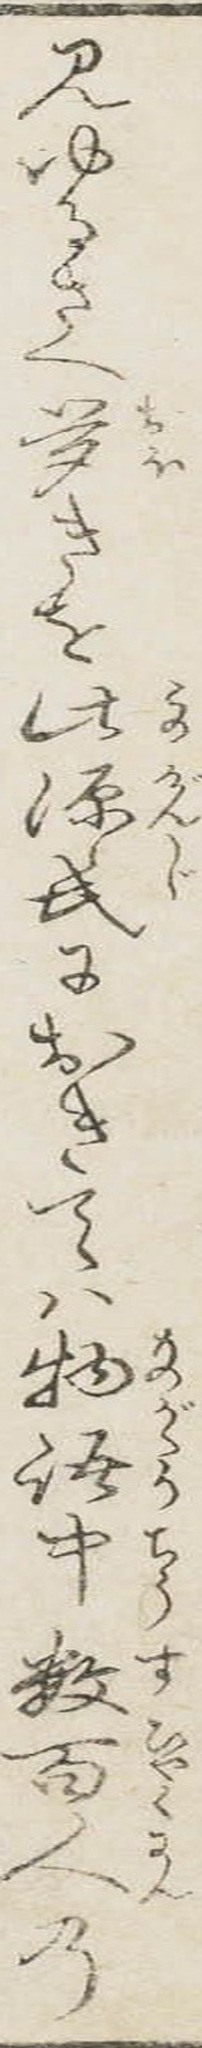見ゆるさへ多きを此源氏におきては物語中数百人の
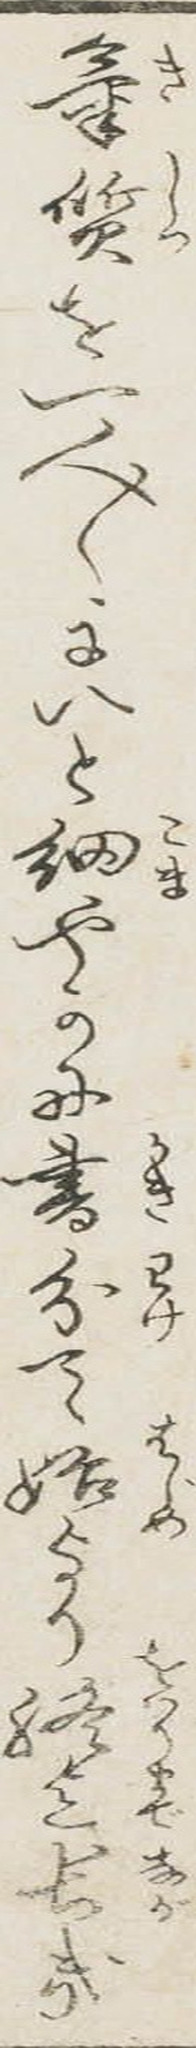き気質を一人〳〵をいと細やかに書分て始より終迄長き
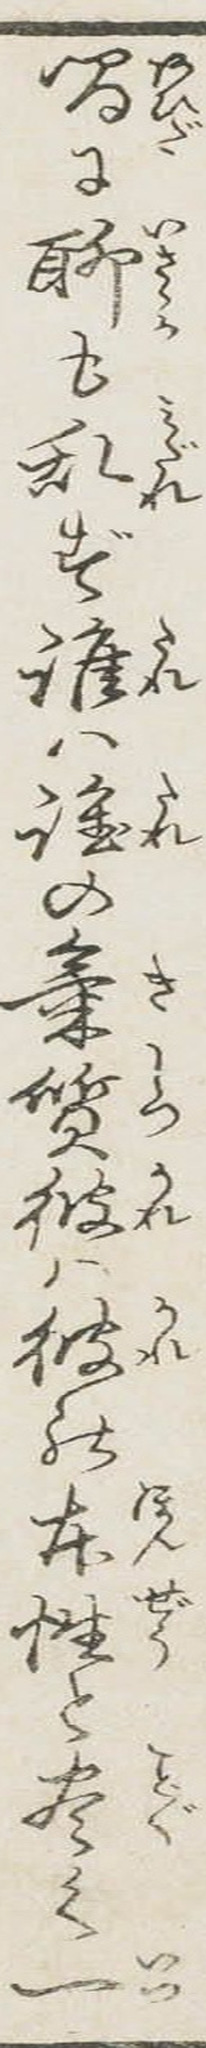間に聊も乱ず誰は誰の気質彼は彼の本性と尽く一
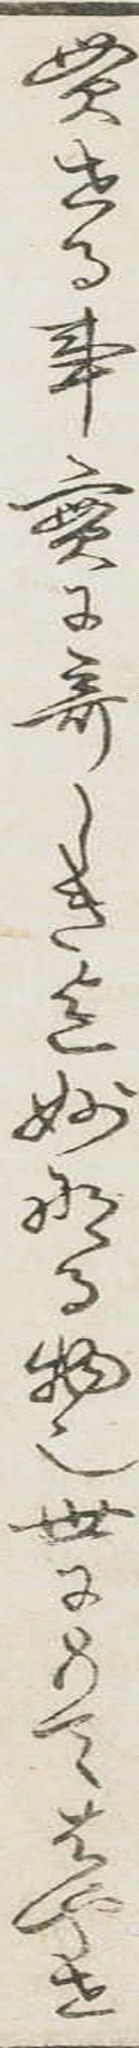貫せる事実に奇しき迄妙なる物也世にもてはやせ
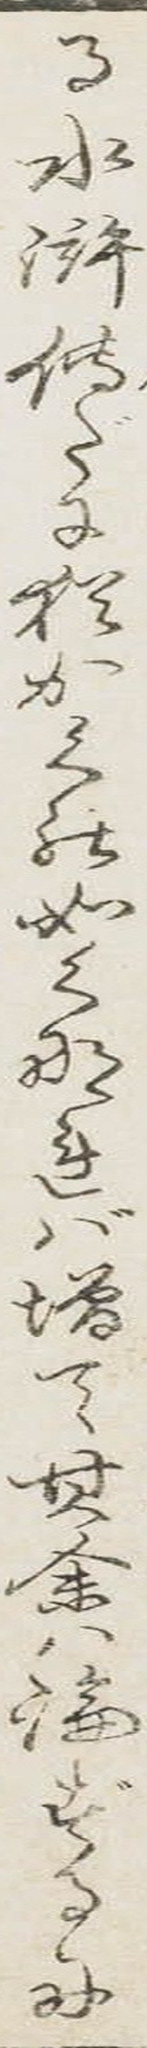る水滸伝だに猶かくの如くなれば増て其余は論ずるに
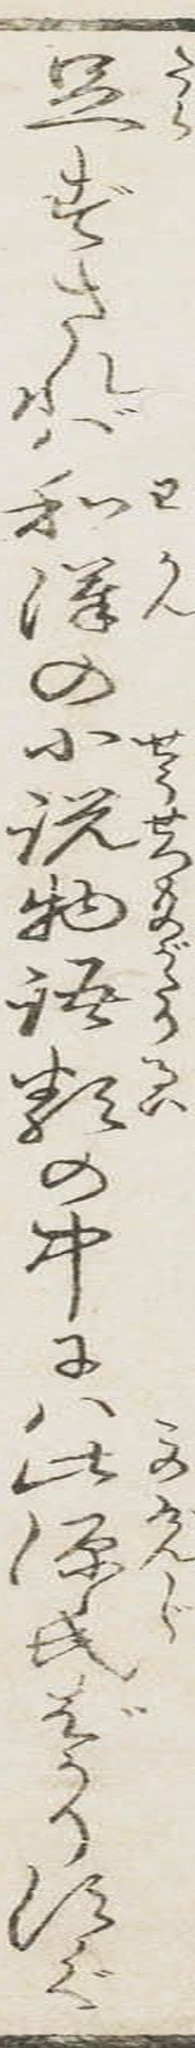足ずされば和漢の小説物語類の中には此源氏ばかりすぐ
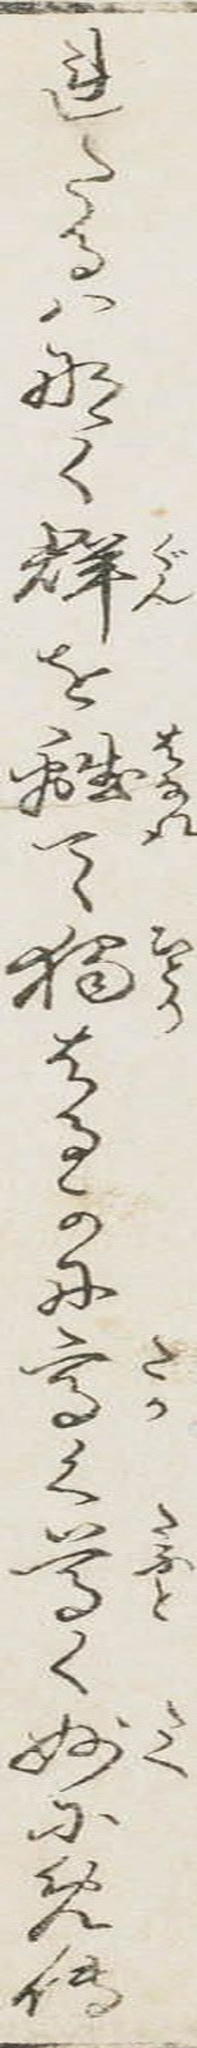れたるはなく群を離て独はるかに高く尊く妙にめて
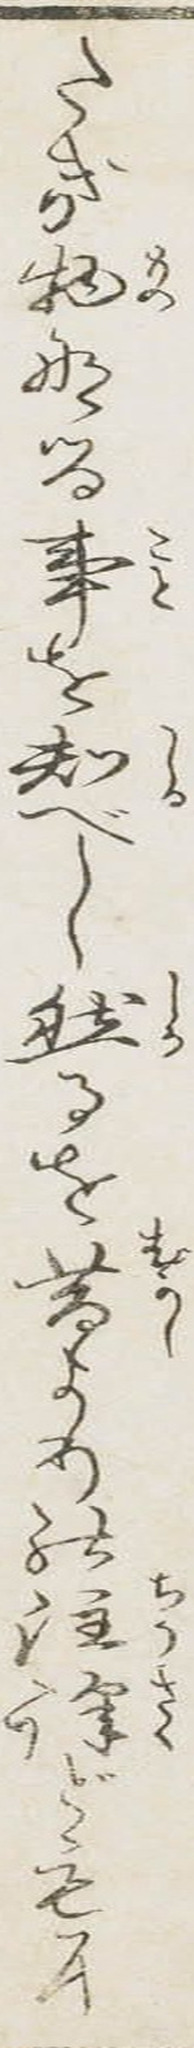たき物なる事を知べし然るを昔よりの注訳どもに
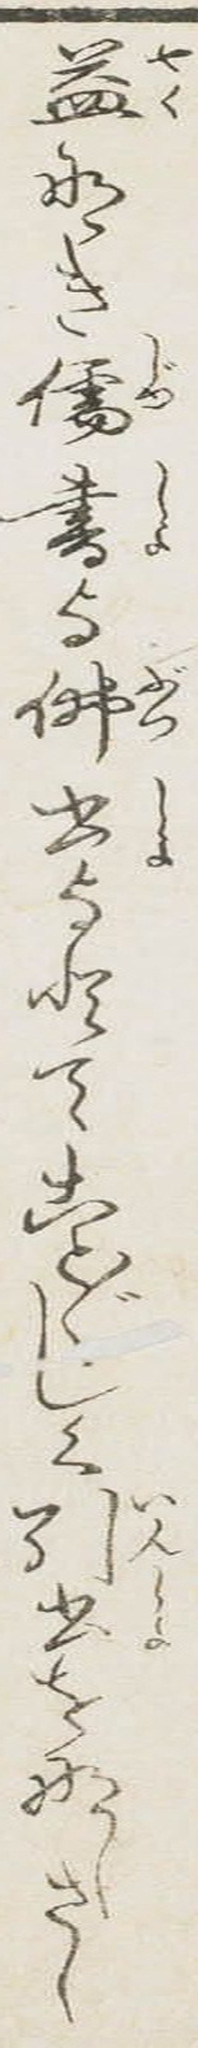益なき儒書よ仏書よとてこと〴〵しく引書をなしさし
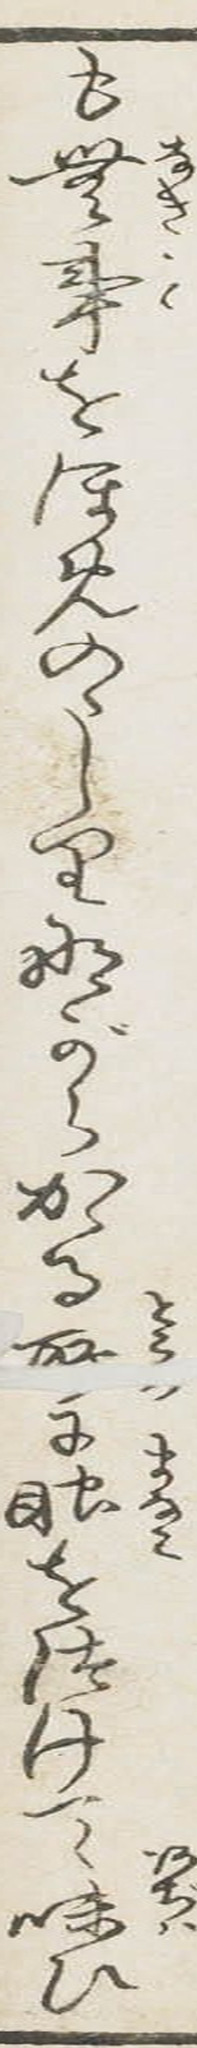も無事をほめのゝしりながらかゝる所に眼をつけて味ひ
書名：源氏百人一首
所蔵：東京学芸大学教育コンテンツアーカイブ
